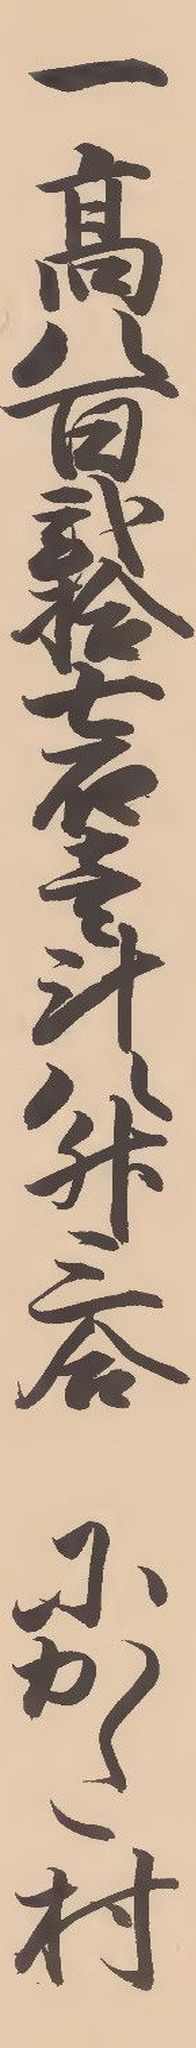一高八百弐拾七石壱斗八升三合にかた村
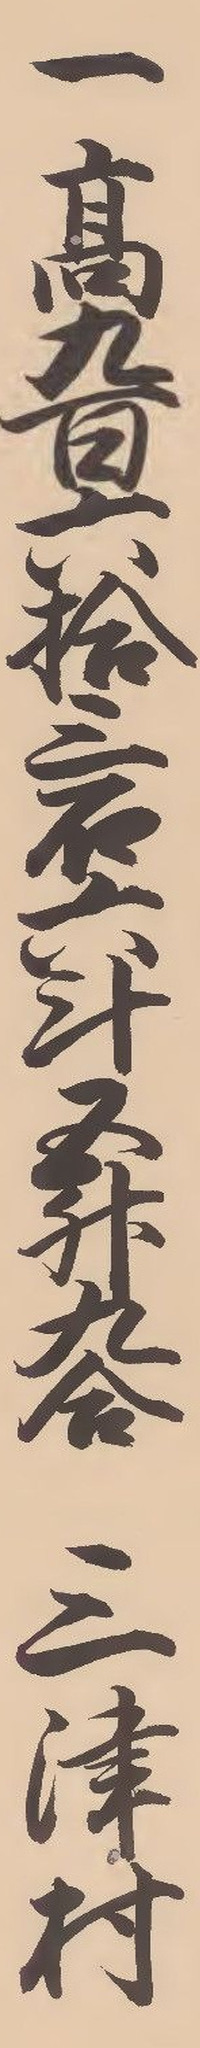一高九百六拾三石六斗五升九合三津村
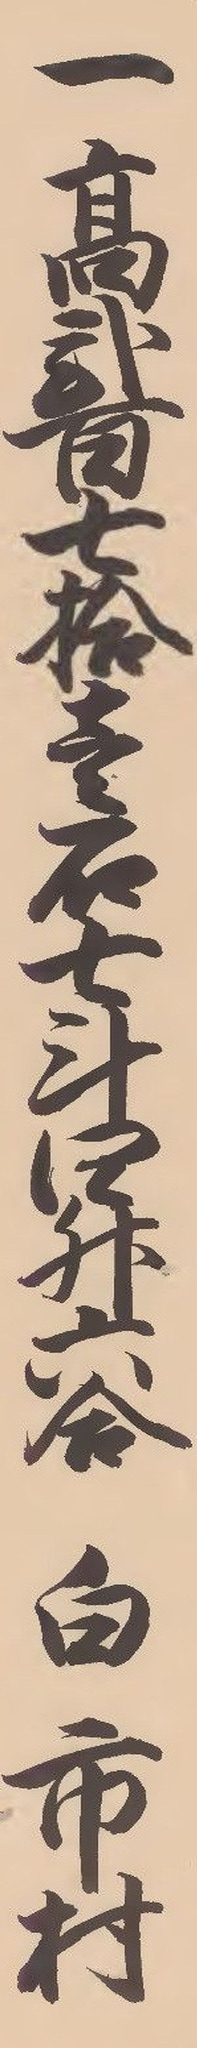一高弐百七拾壱石七斗四升六合白市村

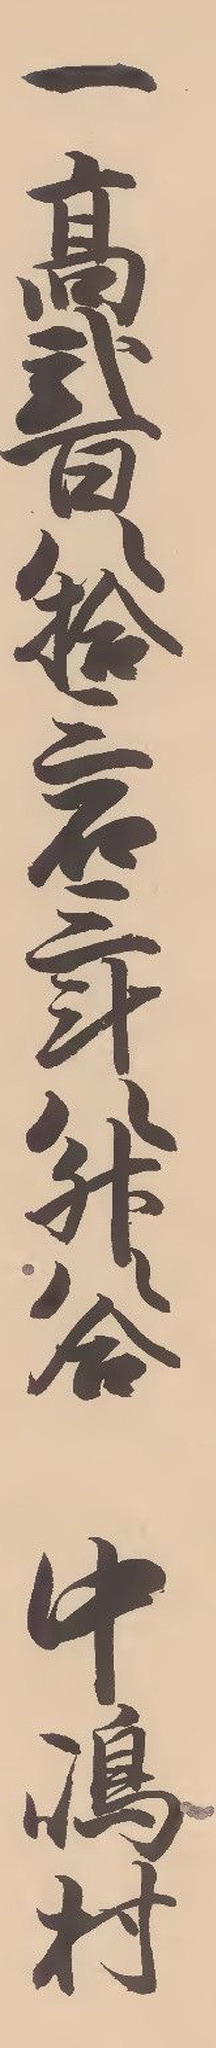一高弐百八拾三石三斗八升八合中島村
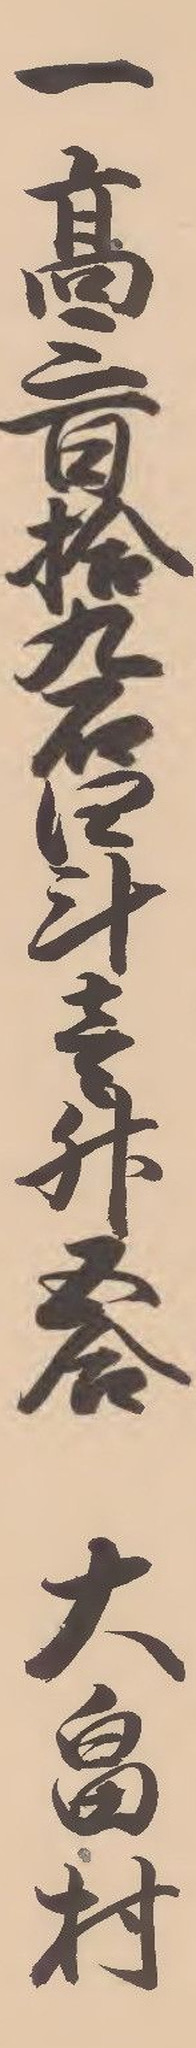一高三百拾九石四斗壱升五合大畠村
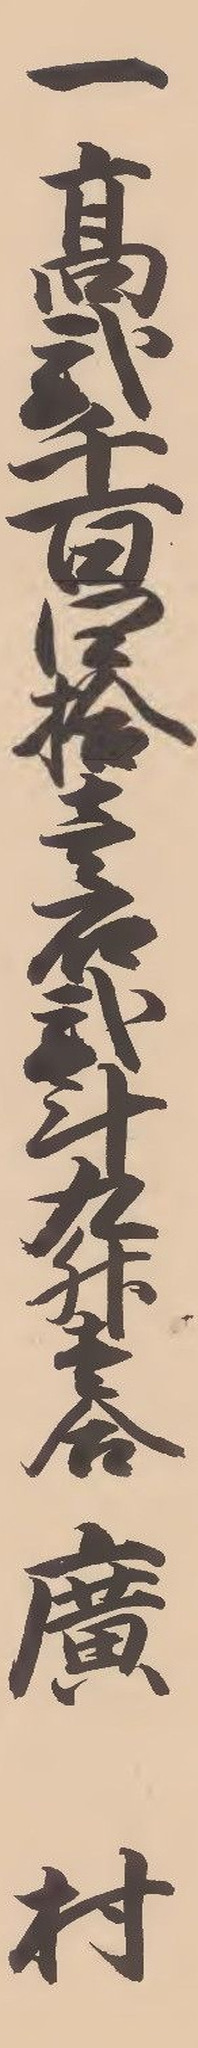一高弐千百四拾壱石弐斗九升壱合広村
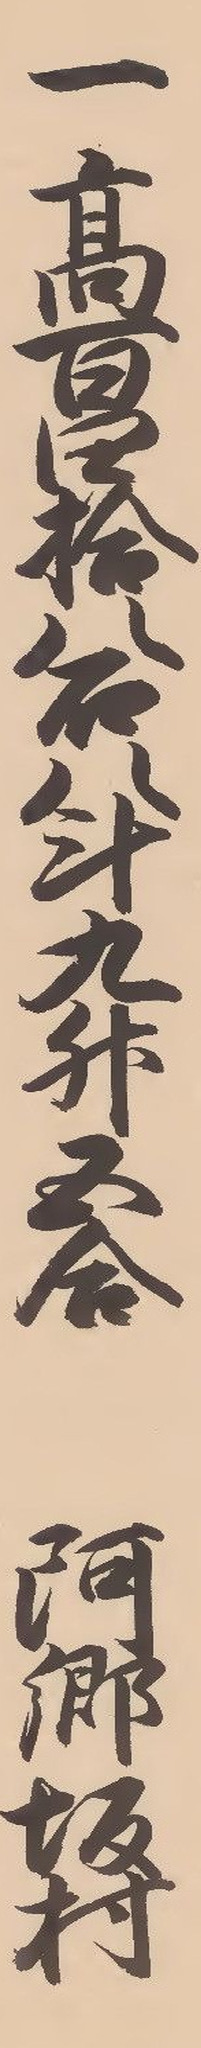一高百四拾八石八斗九升五合阿郷坂村
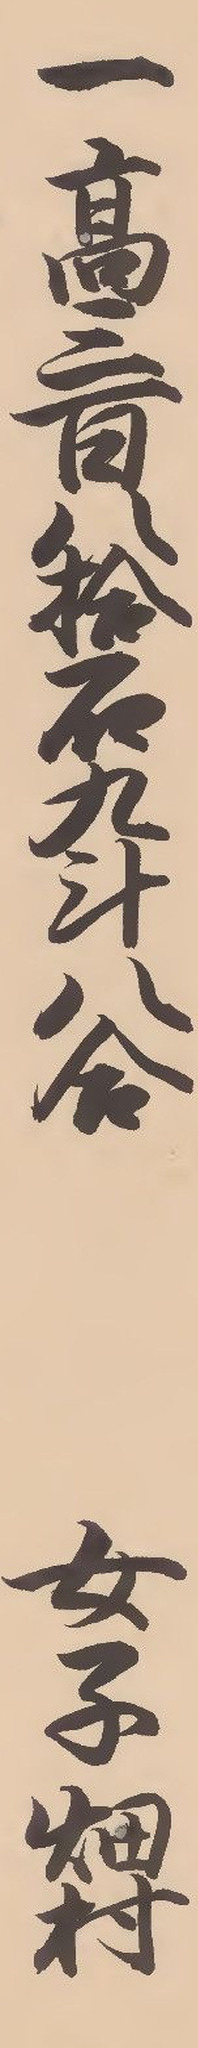一高三百八拾石九斗八合女子畑村
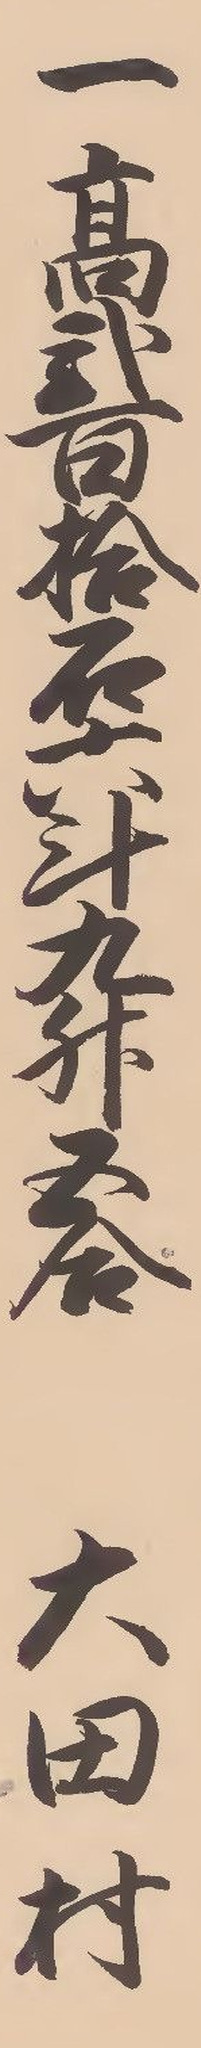一高弐百拾石六斗九升五合大田村

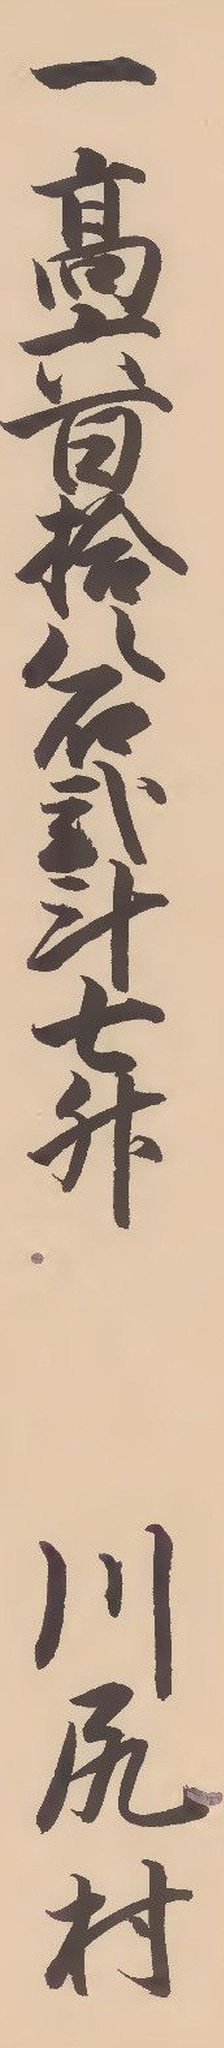一高六百拾八石弐斗七升川尻村
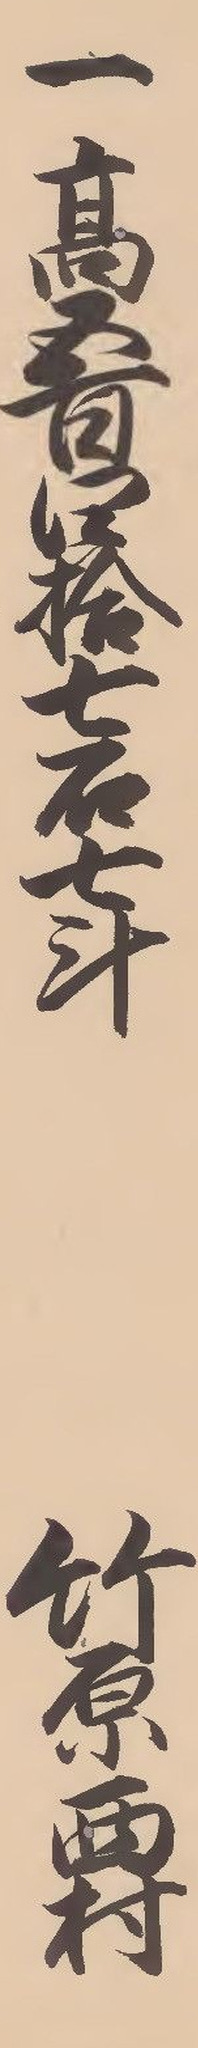一高五百四拾七石七斗竹原西村
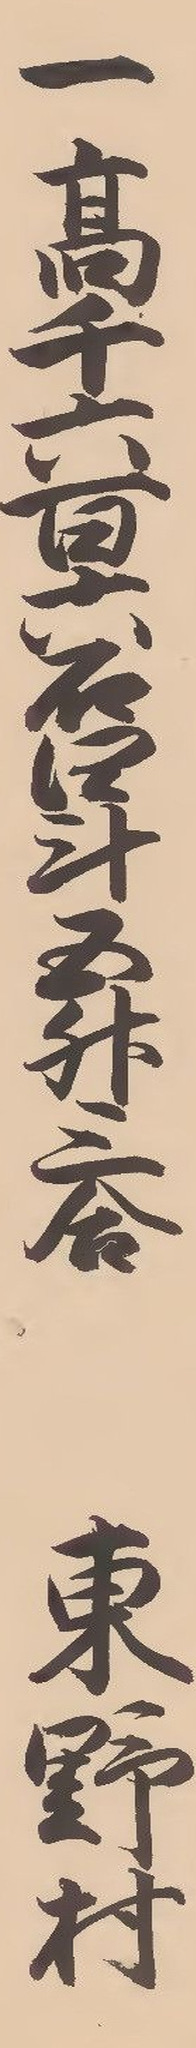一高千六百六石四斗五升三合東野村
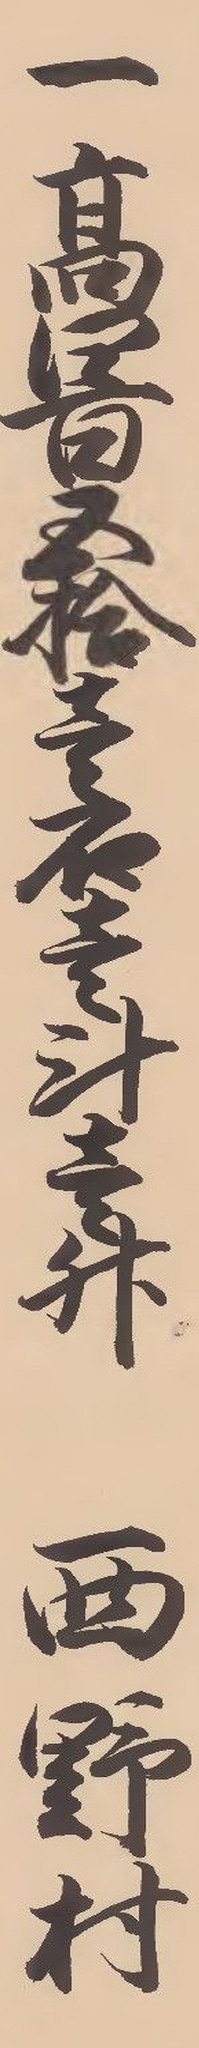一高四百五拾壱石壱斗壱升西野村
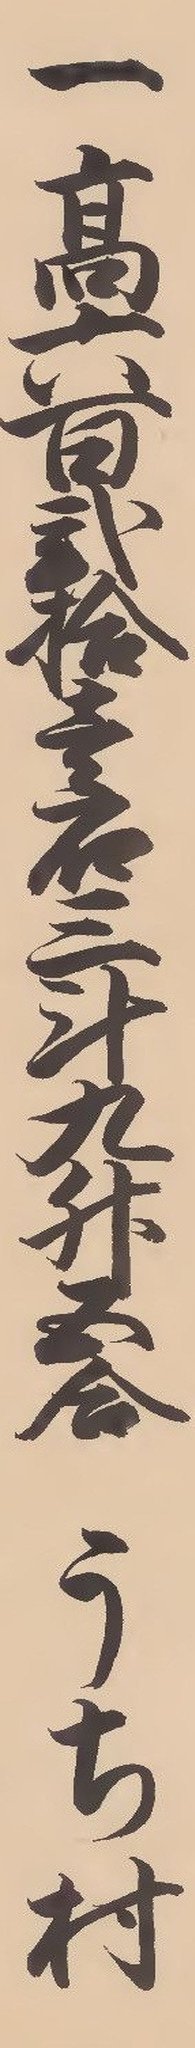一高六百弐拾壱石三斗九升五合うち村
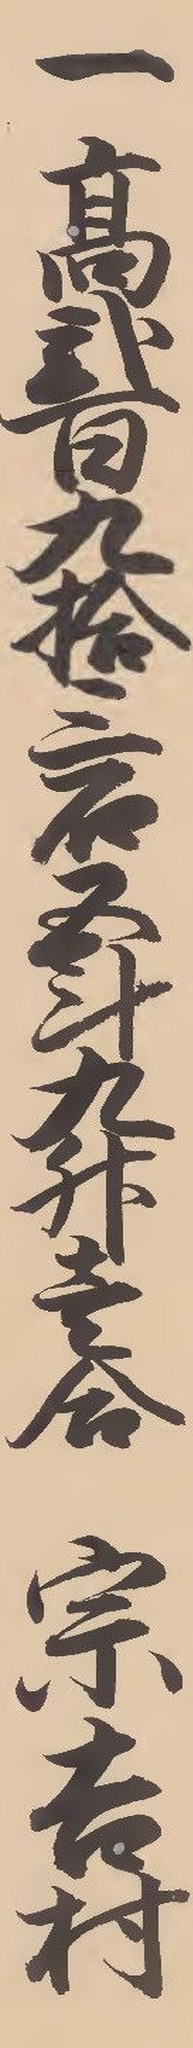一高弐百九拾三石五斗九升壱合宗吉村
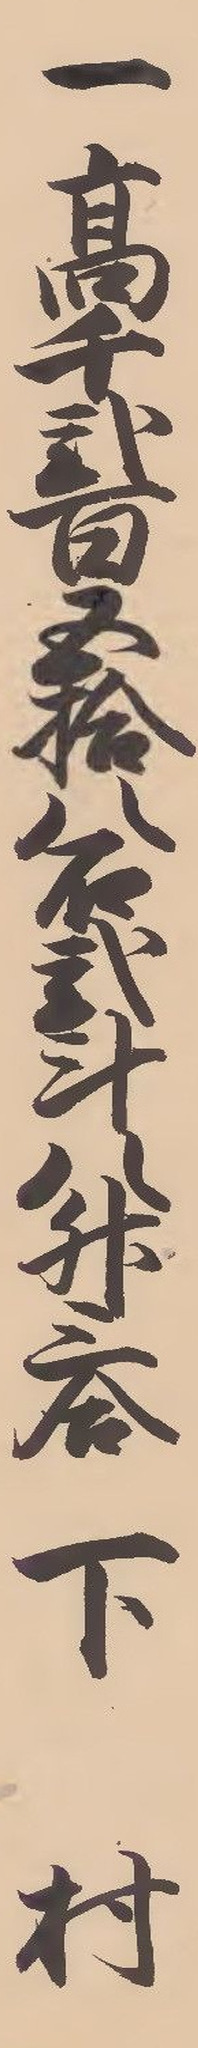一高千弐百五拾八石弐斗八升三合下村
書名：安芸国郷帳
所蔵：国立公文書館 National Archives of Japan
